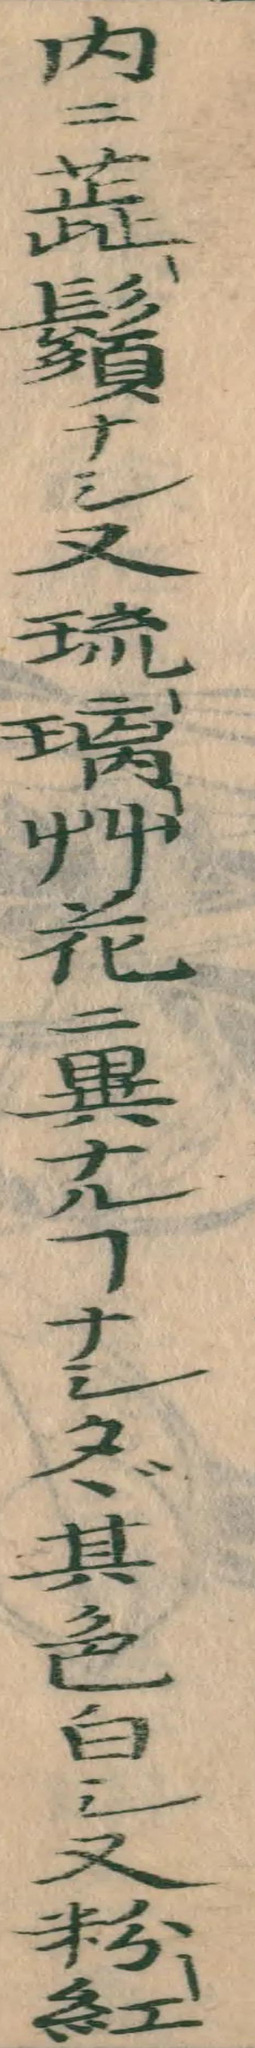内ニ蕊-鬚ナシ又琉-璃-艸花ニ異ナルコトナシタヾ其色白シ又粉-紅
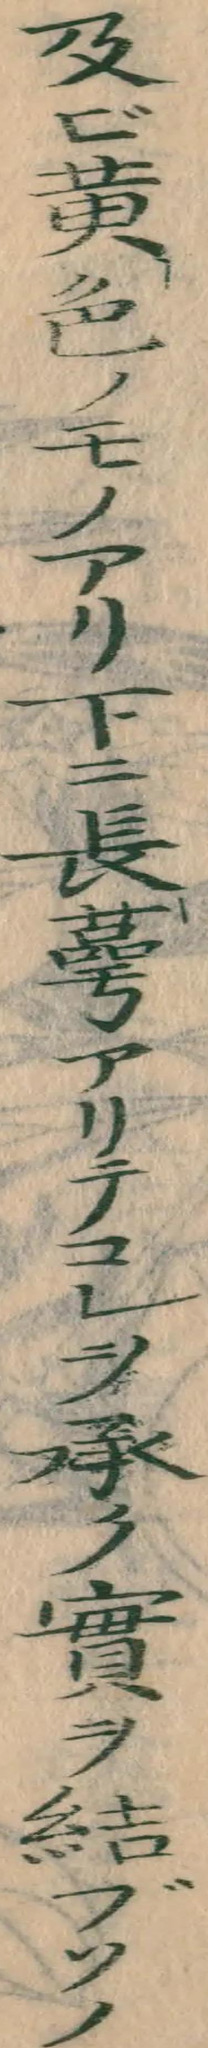及ビ黄-色ノモノアリ下ニ長-萼アリテコレヲ承ク実ヲ結ブソノ

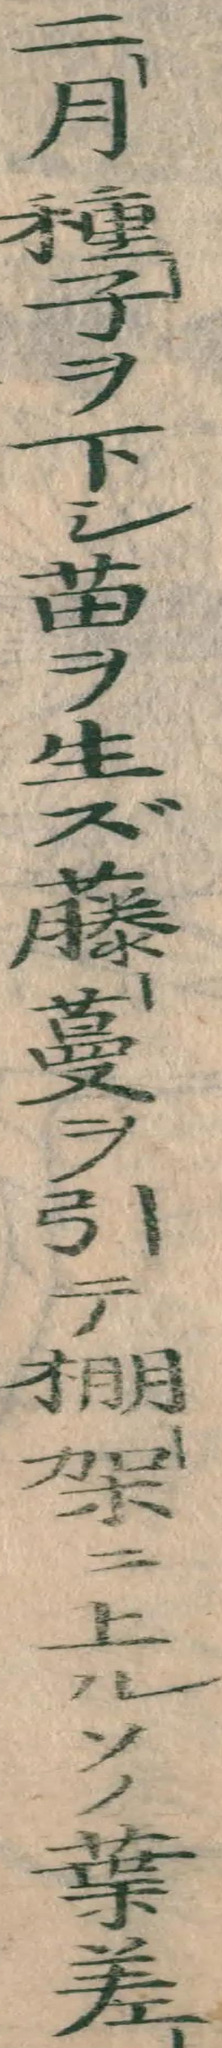二-月種-子ヲ下シ苗ヲ生ズ藤-蔓ヲ引テ棚-架ニ上ルソノ葉差-
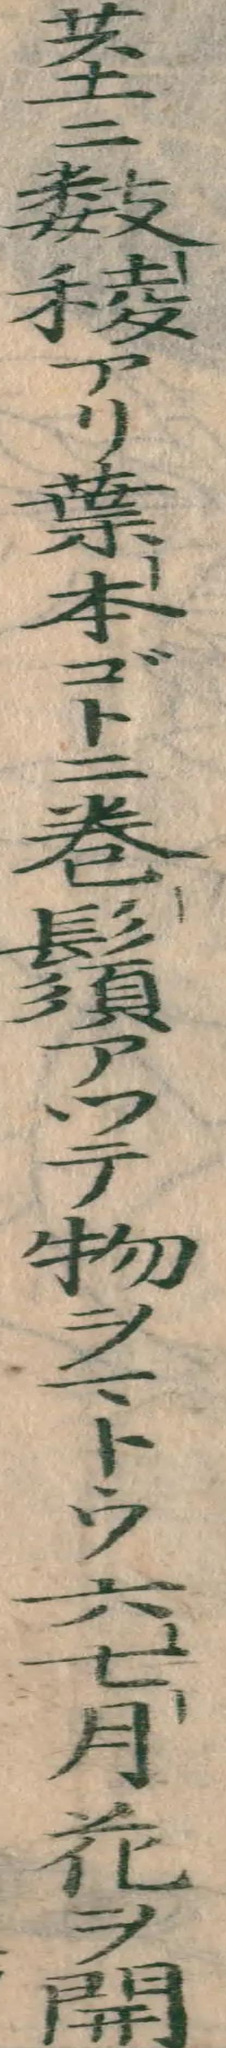茎ニ数-稜アリ葉-本ゴトニ巻-鬚アツテ物ヲマトウ六-七-月花ヲ開
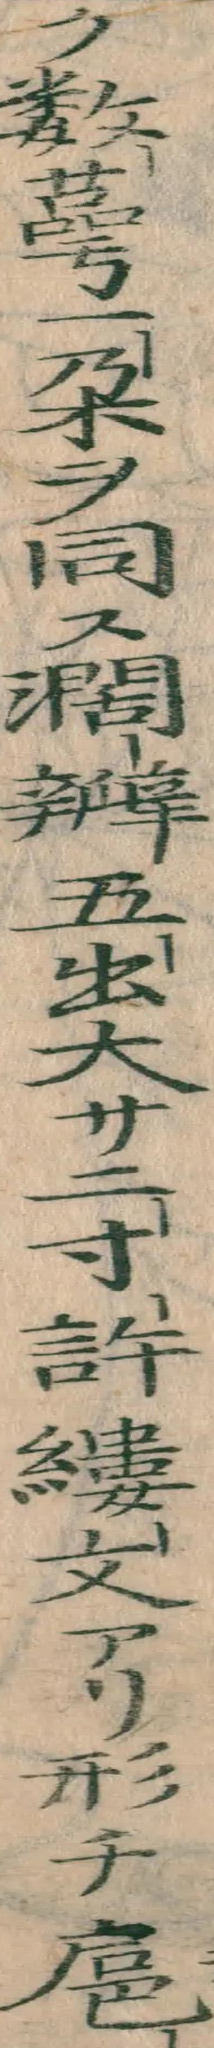ク数-萼一-朶ヲ同ス闊-弁五-出大サ二-寸-許縷-文アリ形チ扈-
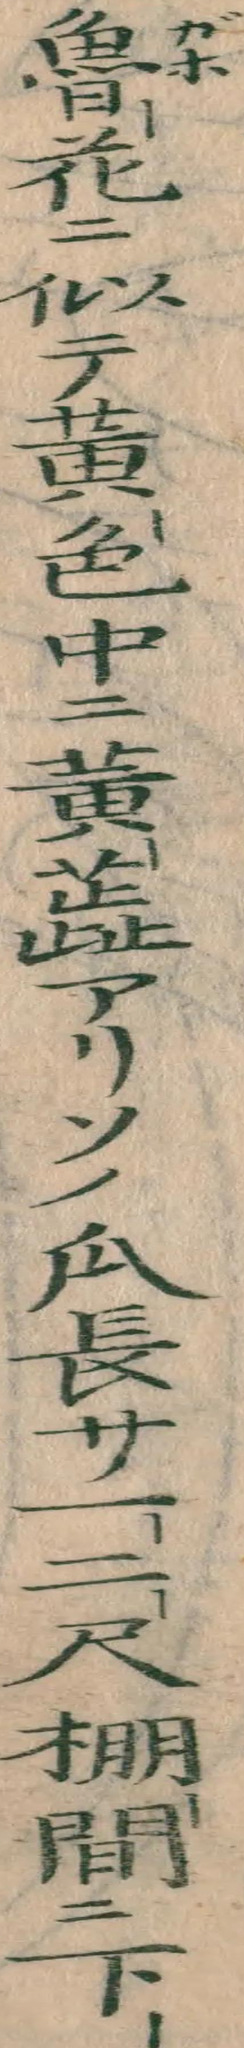魯-花ニ似テ黄-色中ニ黄-蕊アリソノ瓜長サ一-二-尺棚-間ニ下-
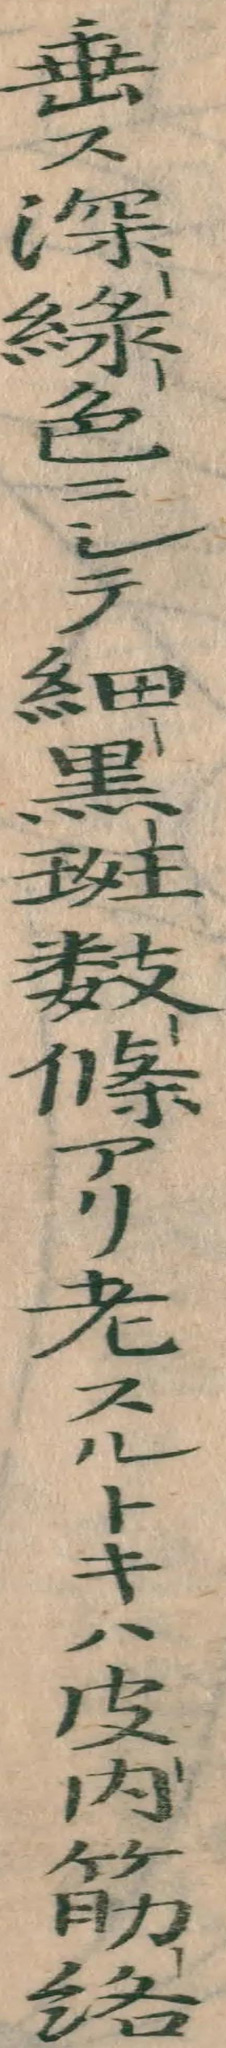垂ス深-緑-色ニシテ細-黒-斑数-条アリ老スルトキハ皮-内筋-絡
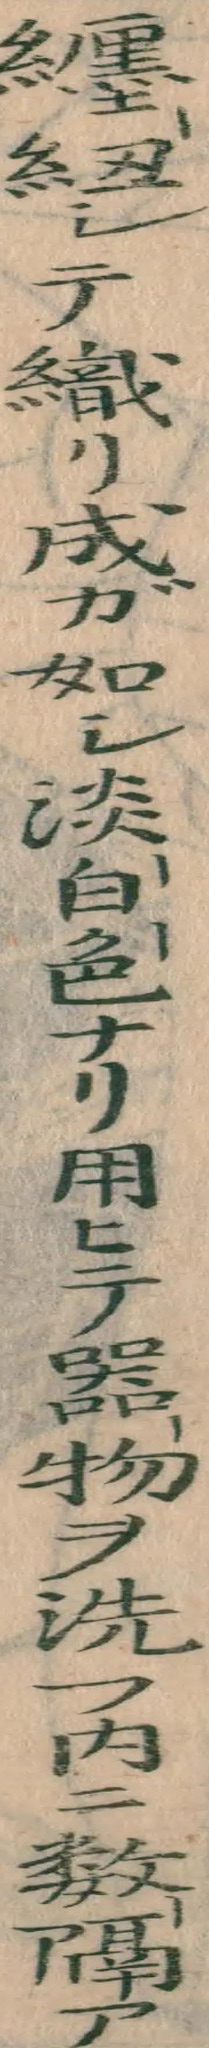纏-紐シテ織リ成ガ如シ淡-白-色ナリ用ヒテ器-物ヲ洗フ内ニ数-隔ア
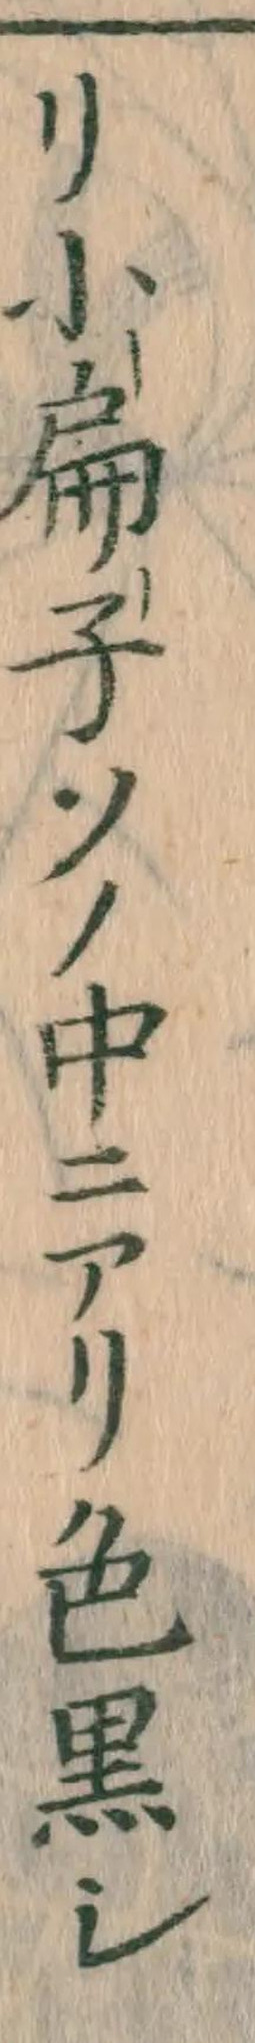リ小-扁-子ソノ中ニアリ色黒シ
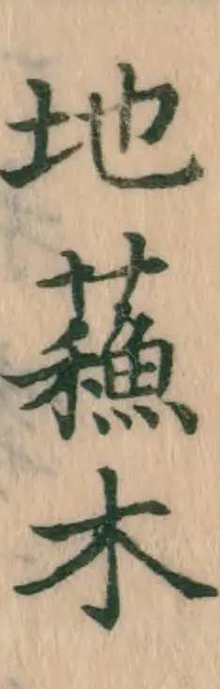地蘇木

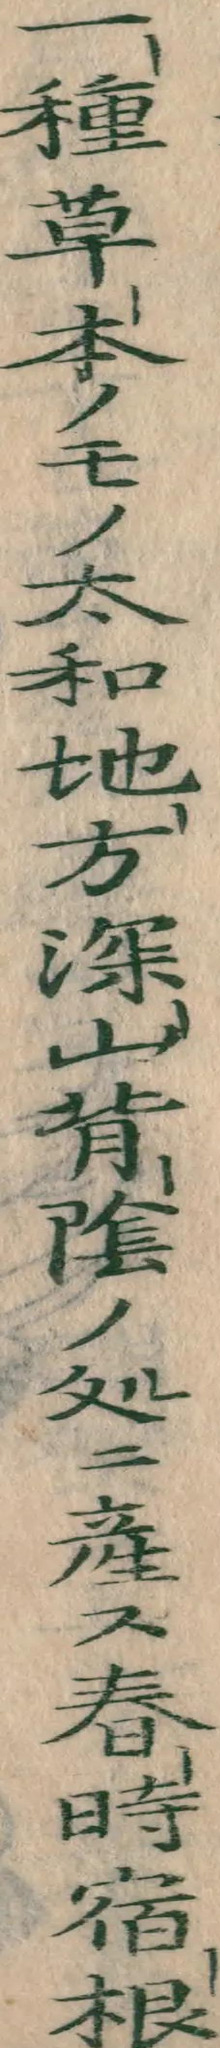一-種草-本ノモノ太和地-方深-山背-陰ノ処ニ産ス春-時宿-根
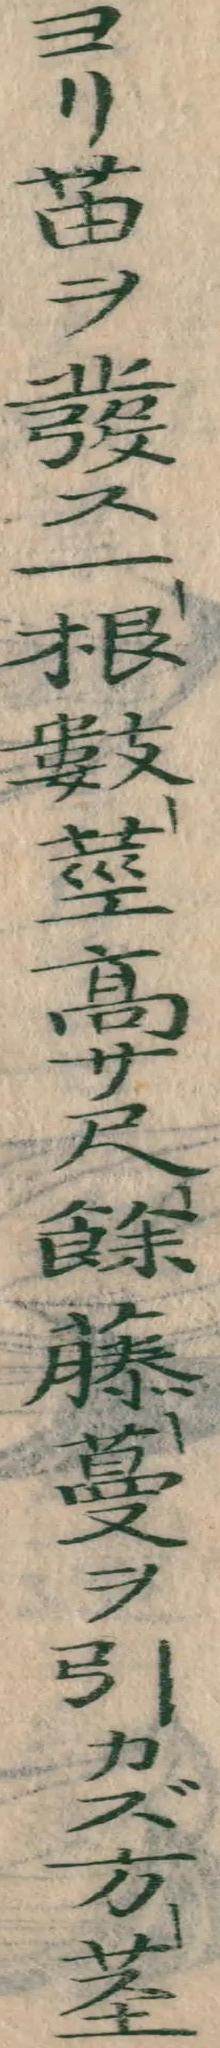ヨリ苗ヲ発ス一-根数-茎高サ尺-余藤-蔓ヲ引カズ方-茎
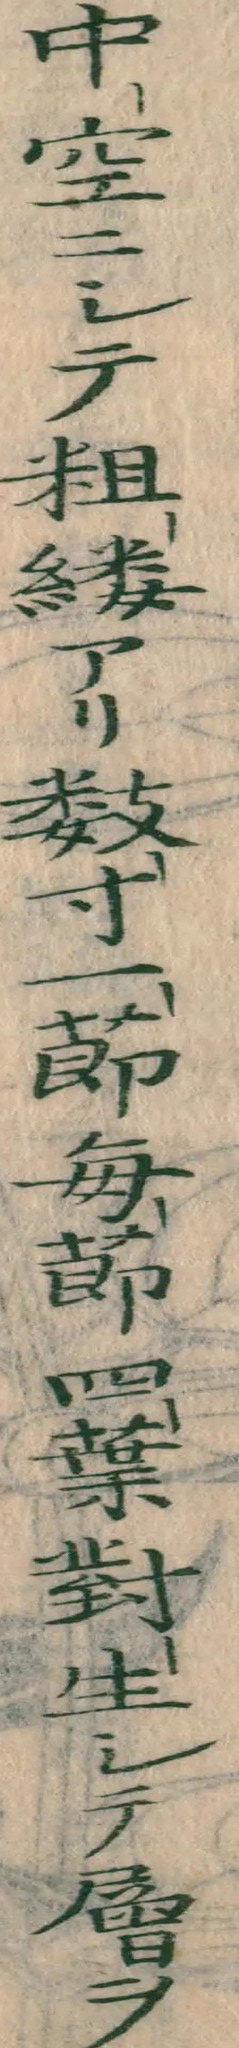中-空ニシテ粗-縷アリ数-寸一-節毎-節四-葉対-生シテ層ヲ
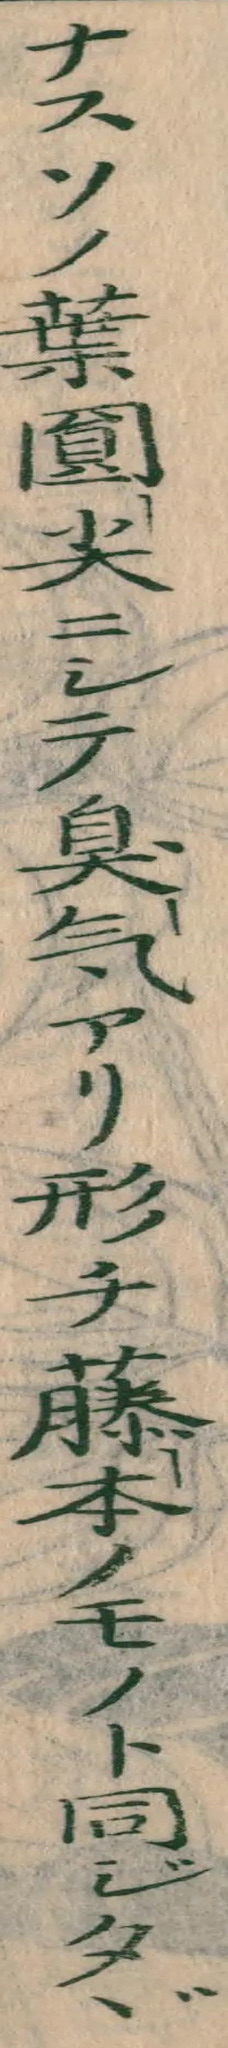ナスソノ葉円-尖ニシテ臭-気アリ形チ藤-本ノモノト同ジタヾ
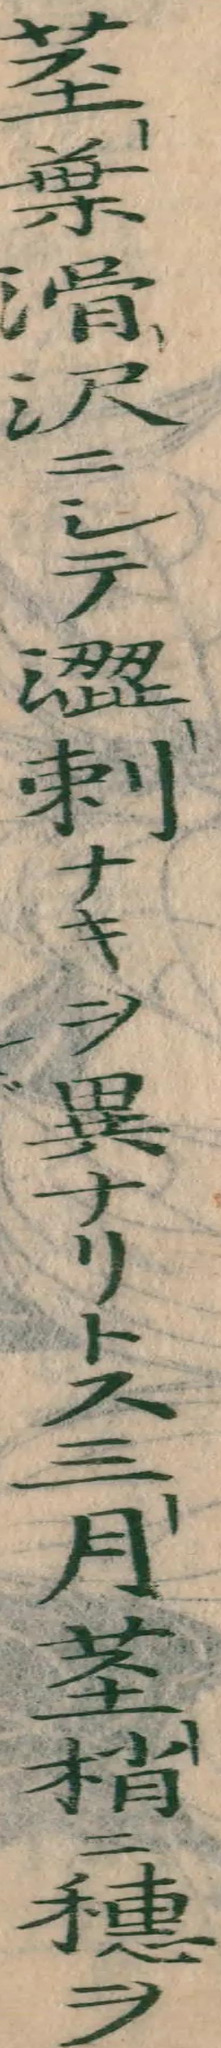茎-葉滑-沢ニシテ渋-剌ナキヲ異ナリトス三-月茎-梢ニ穂ヲ
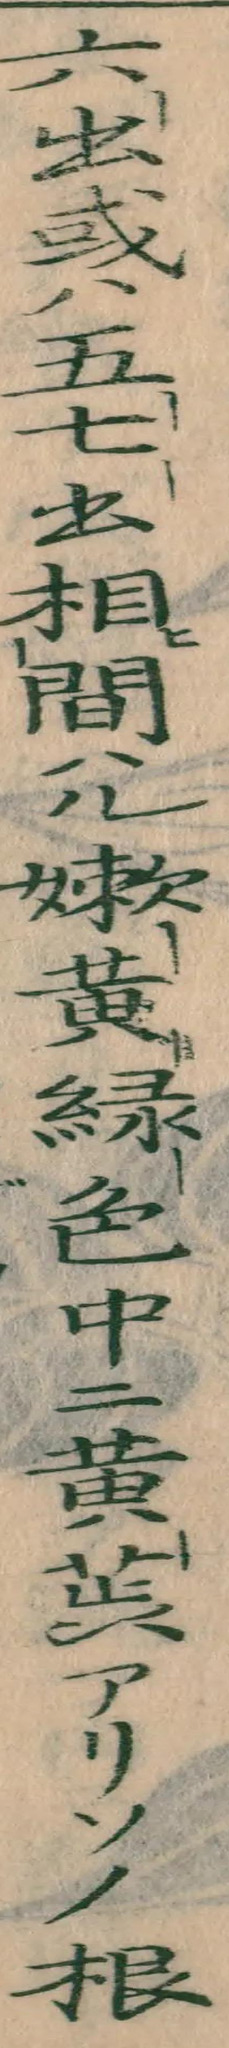六-出或ハ五-七-出相-間ハル嫩-黄-緑-色中ニ黄-蕋アリソノ根
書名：花彙 草部4巻木部4巻. [1]
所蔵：国立国会図書館 National Diet Library, JAPAN
